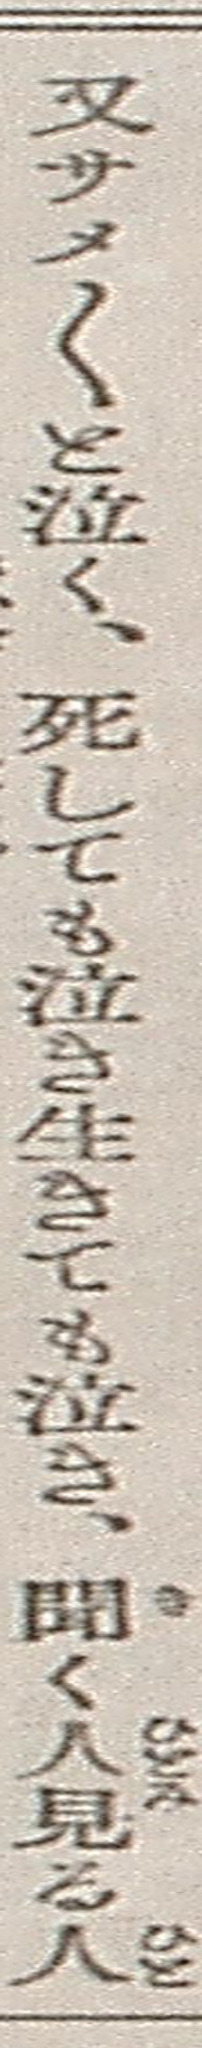又サメ〳〵と泣く、死しても泣き生きても泣き、聞く人見る人
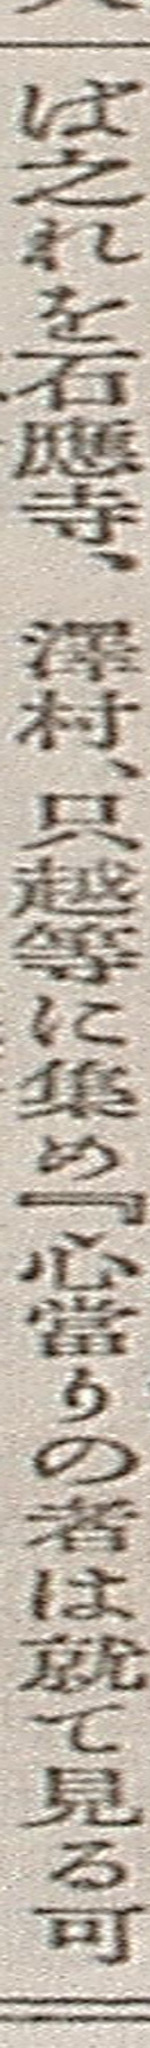ば之れを石応寺、沢村、只越等に集め『心当りの者は就て見る可
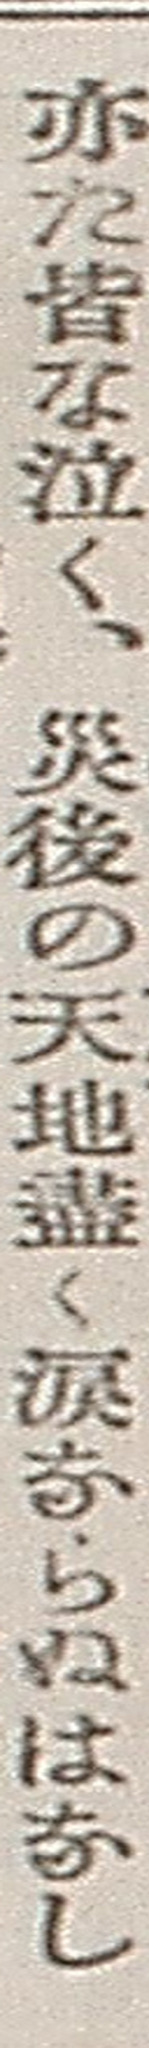亦た皆な泣く、災後の天地尽く涙ならぬはなし
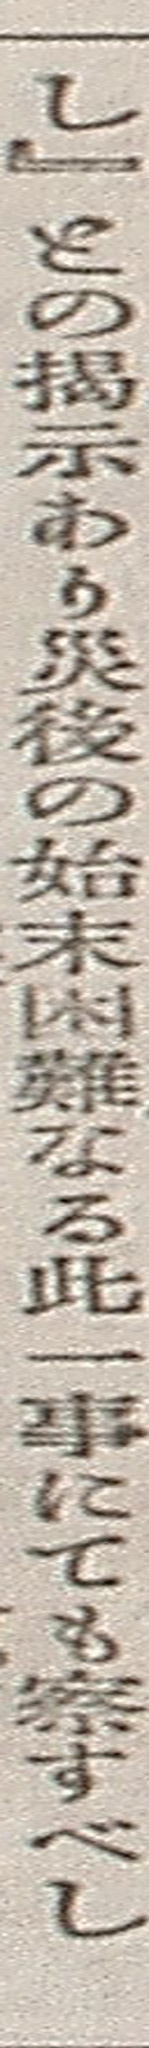し』との掲示あり災後の始末困難なる此一事にても察すべし
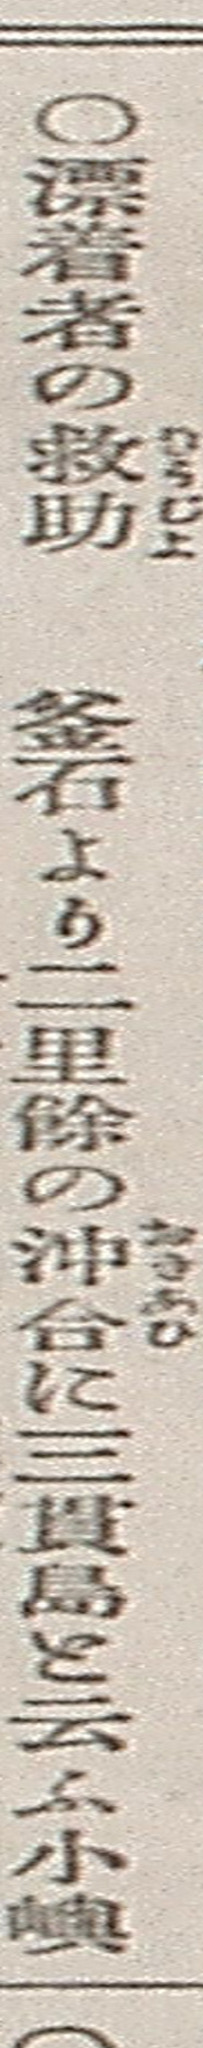○漂着者の救助釜石より二里余の沖合に三貫島と云ふ小嶼
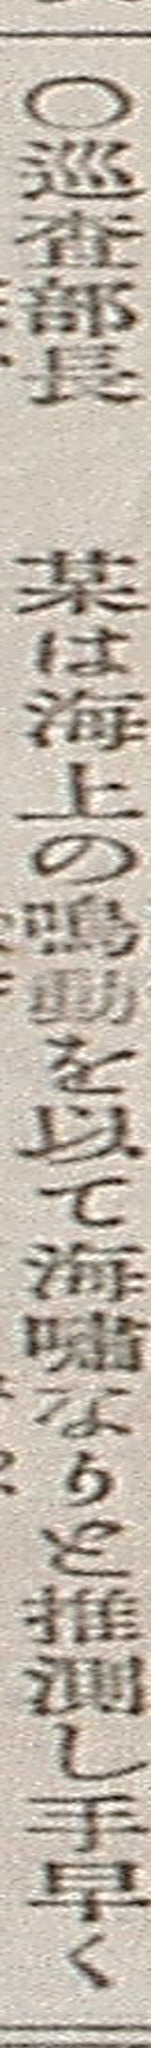○巡査部長某は海上の鳴動を以て海嘯なりと推測し手早く
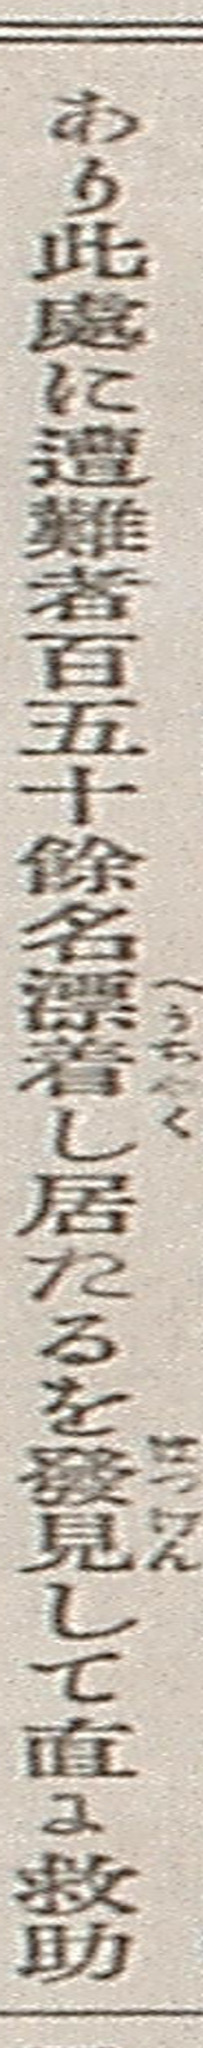あり此処に遭難者百五十余名漂着し居たりを発見して直に救助
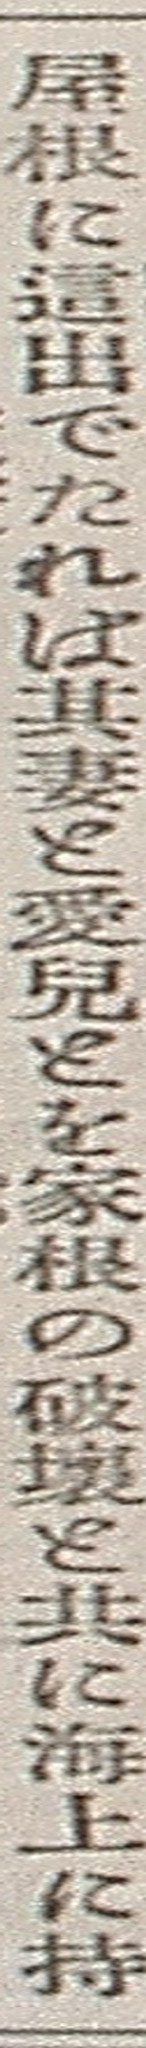屋根に這出でたれば其妻と愛児とを家根の破壊と共に海上に持
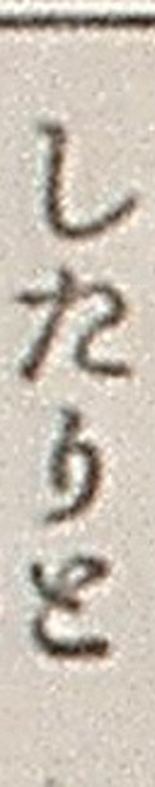したりと
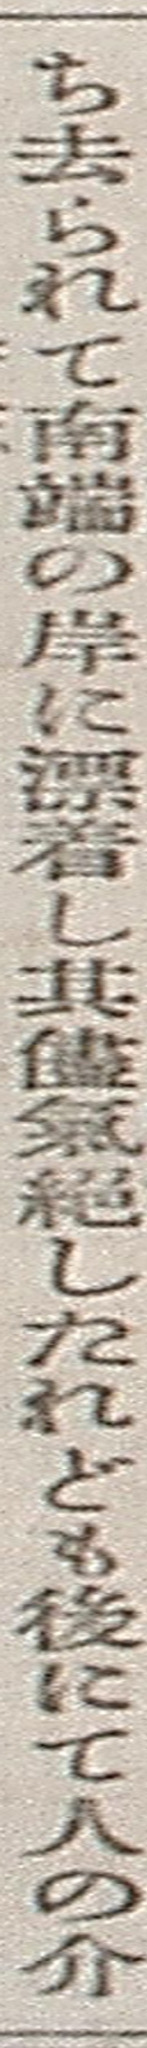ち去られて南端の岸に漂着し其侭気絶したれども後にて人の介
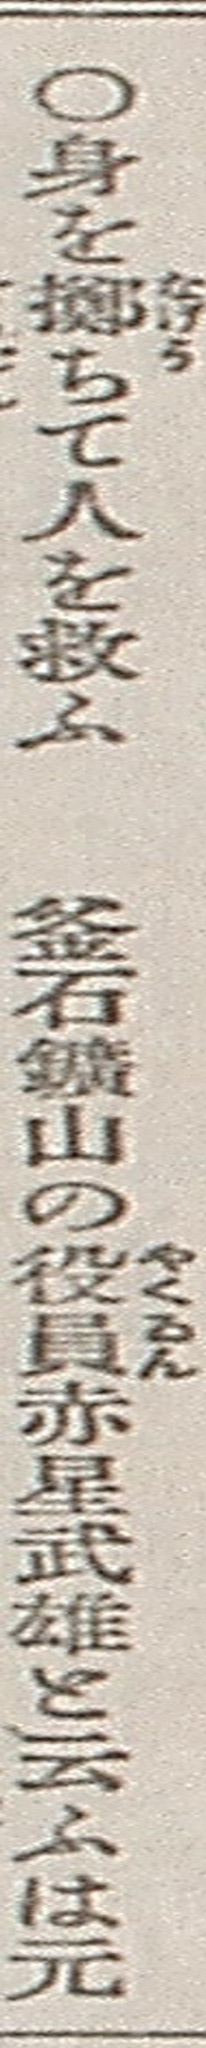○身を擲ちて人を救ふ釜石鉱山の役員赤星武雄と云ふは元
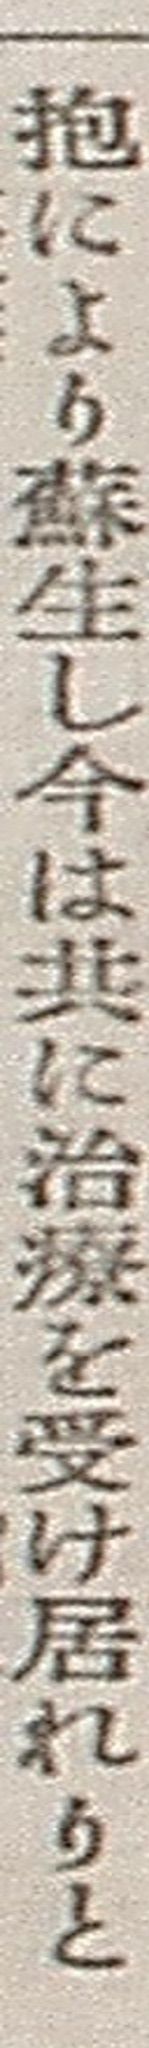抱により蘇生し今は共に治療を受け居れりと
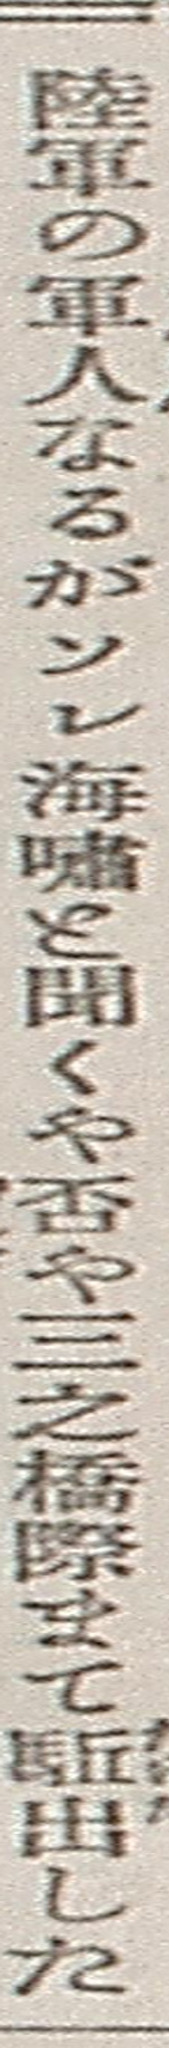陸軍の軍人なるがソレ海嘯と聞くや否や三之橋際まて駈出した
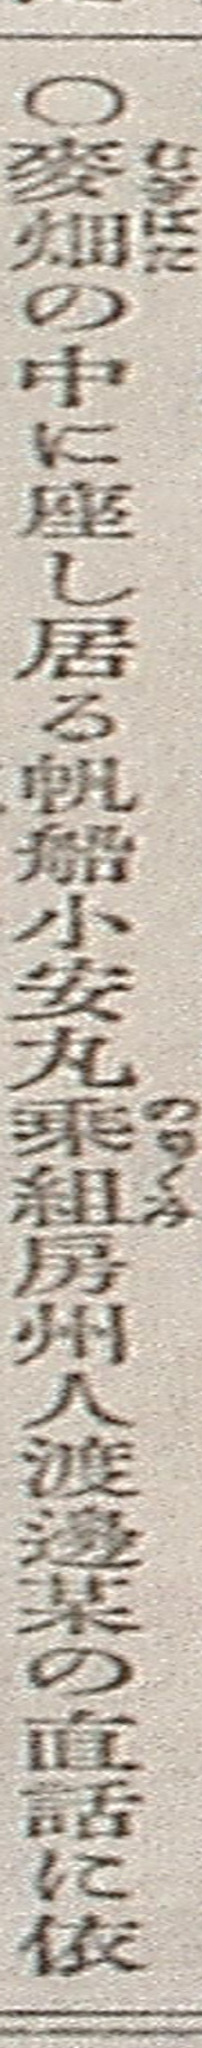○麦畑の中に座し居る帆船小安丸乗組房州人渡辺某の直話に依
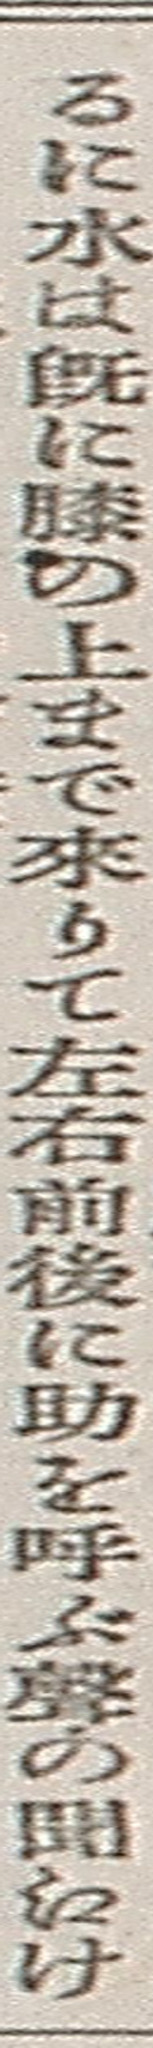るに水は既に膝の上まで来りて左右前後に助を呼ぶ声の聞えけ
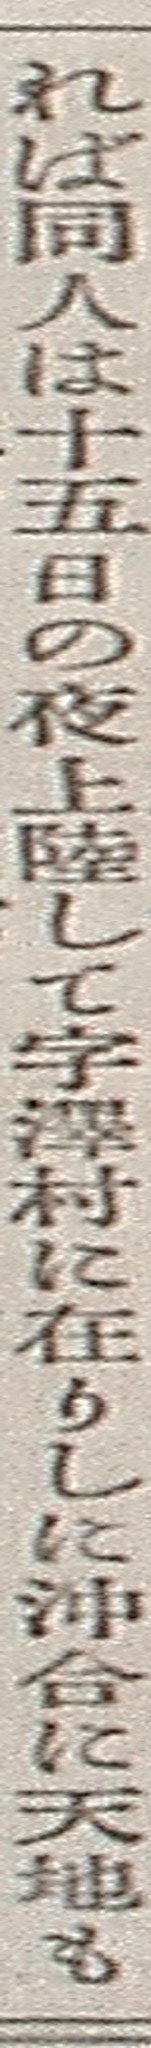れば同人は十五日の夜上陸して字沢村に在りしに沖合に天地も
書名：風俗畫報臨時増刊第百十九號　大海嘯被害録（中）
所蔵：東京大学地震研究所図書室 Earthquake Research Institute Library, The University of Tokyo, JAPAN
